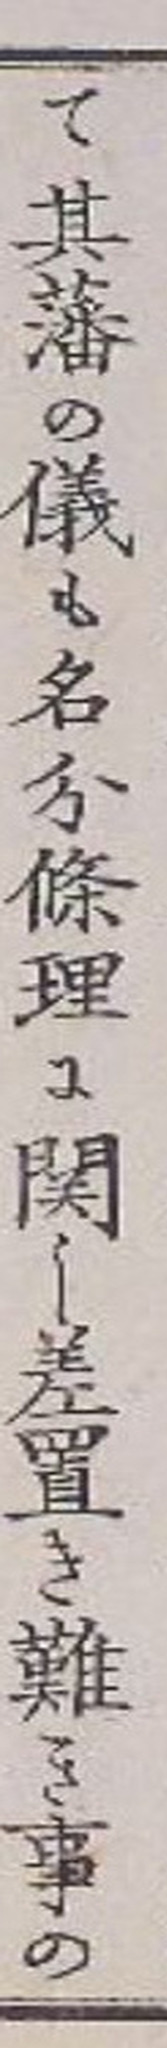て其藩の儀も名分条理に関し差置き難き事の
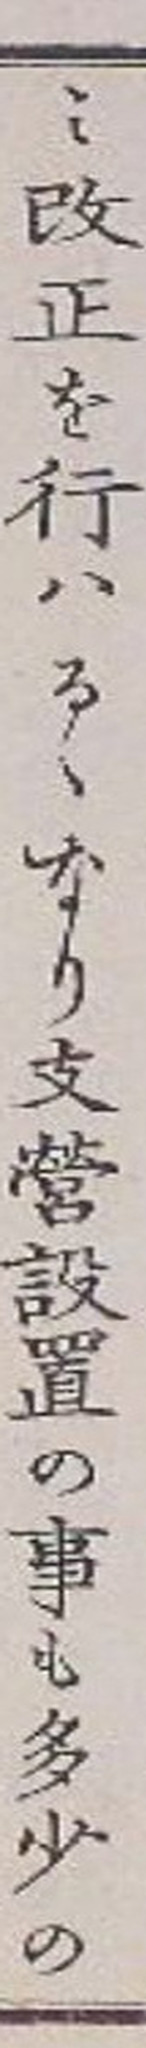み改正を行はるゝなり支営設置の事も多少の
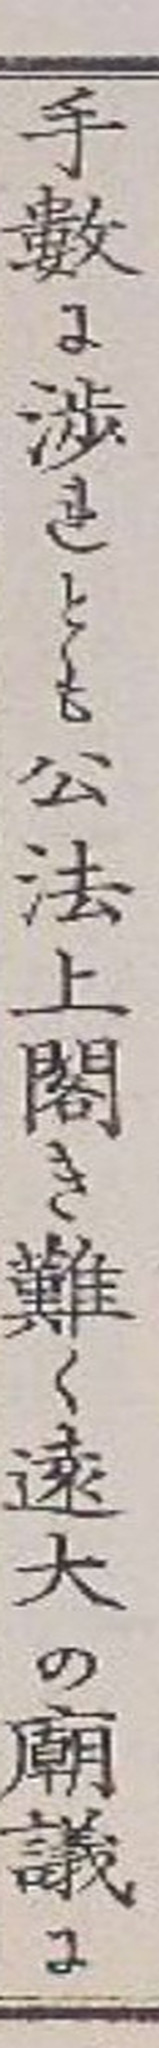手数に渉れとも公法上閣き難く遠大の廟議に
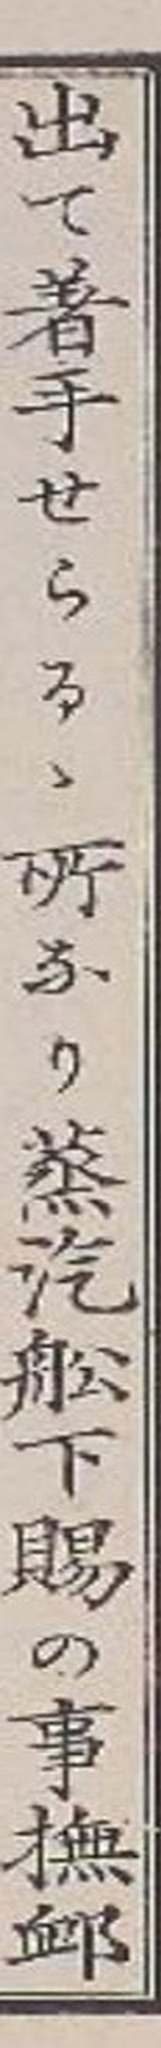出て着手せらるゝ所なり蒸気船下賜の事撫卹
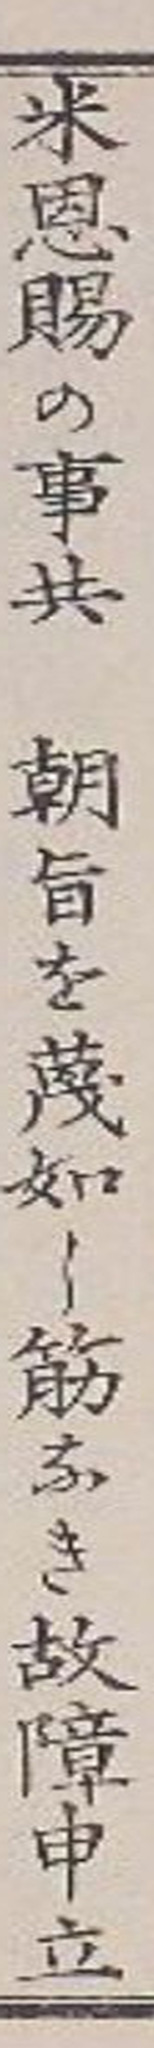米恩賜の事共朝旨を蔑如し筋なき故障申立
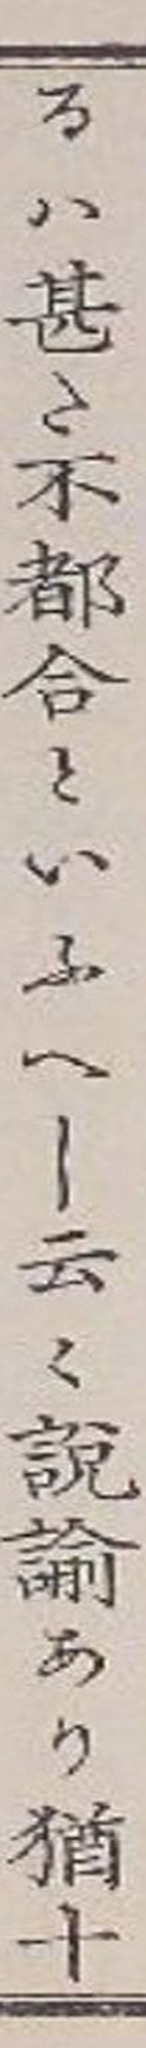るは甚た不都合といふへし云々説諭あり猶十
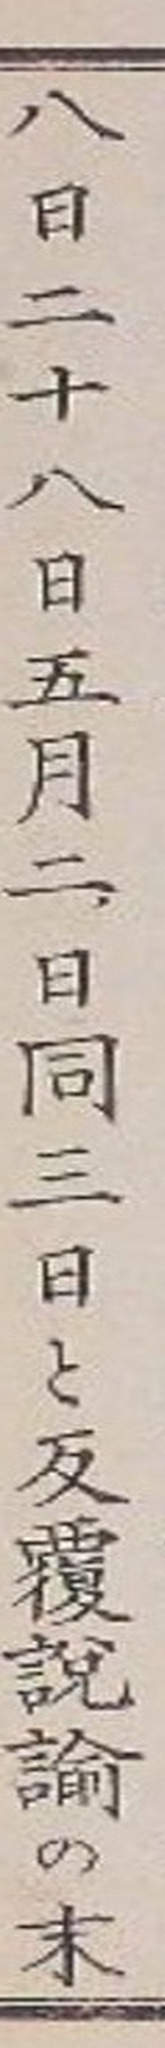八日二十八日五月二日同三日と反覆説諭の末
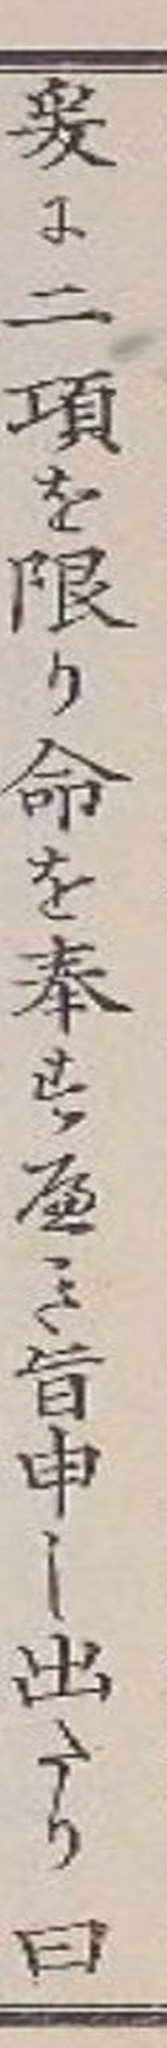爰に二項を限り命を奉すへき旨申し出たり曰
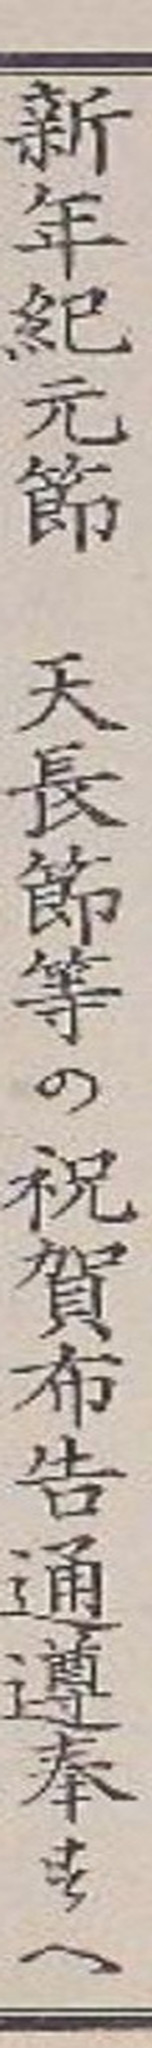新年紀元節天長節等の祝賀布告通遵奉すへ
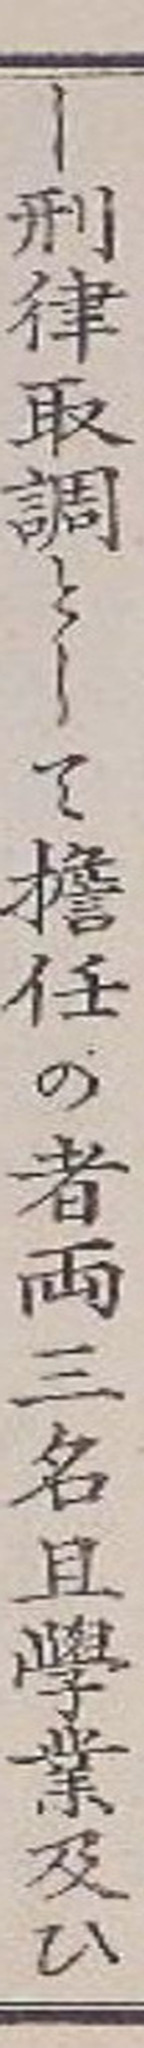し刑律取調として担任の者両三名且学業及ひ
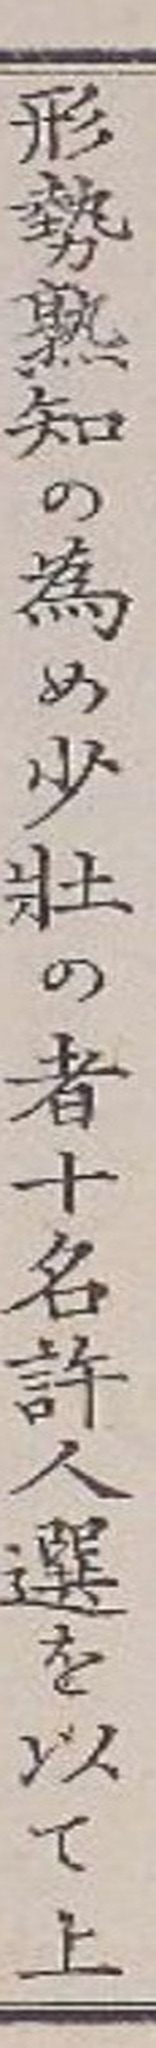形勢熟知の為め少壮の者十名許人選を以て上
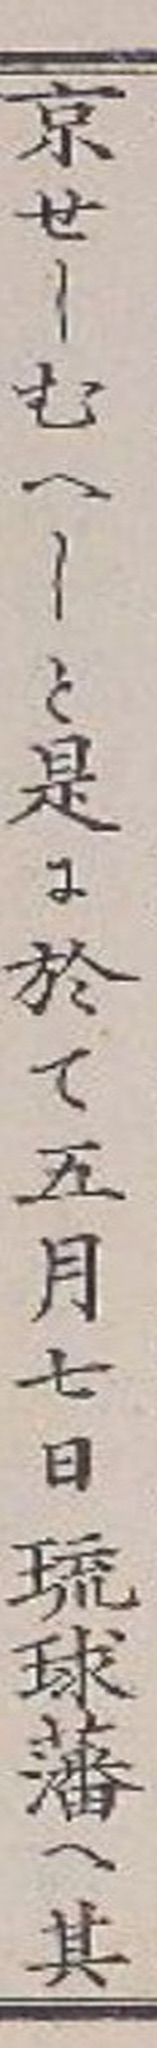京せしむへしと是に於て五月七日琉球藩へ其
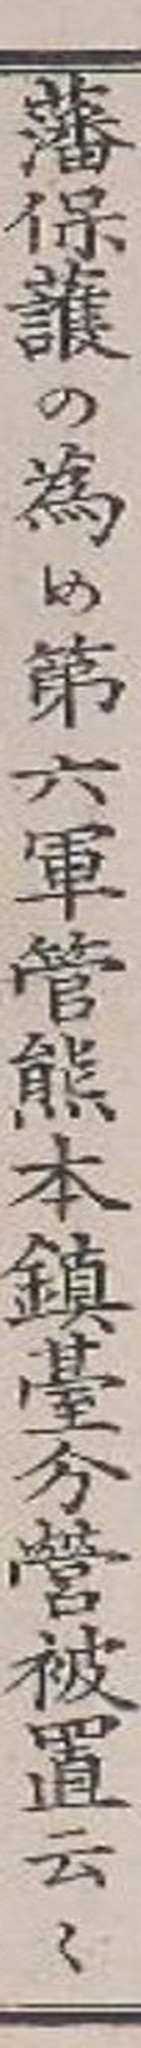藩保護の為め第六軍管熊本鎮台分営被置云々

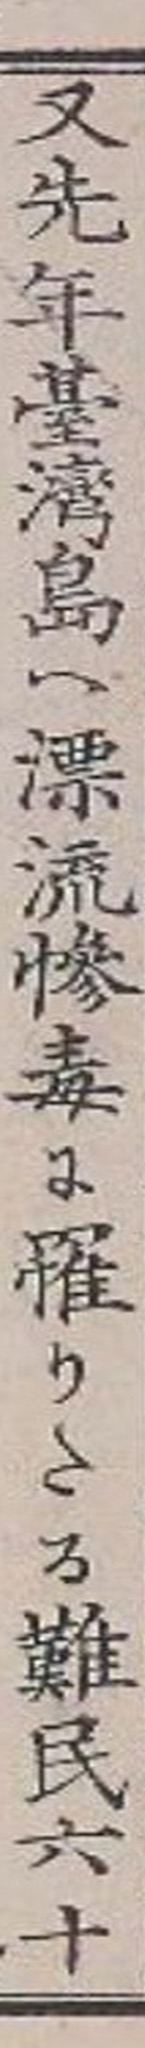又先年台湾島へ漂流惨毒に罹りたる難民六十
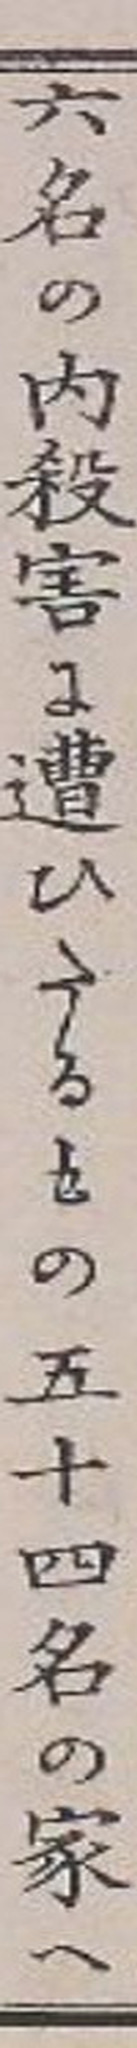六名の内殺害に遭ひたるもの五十余名の家へ
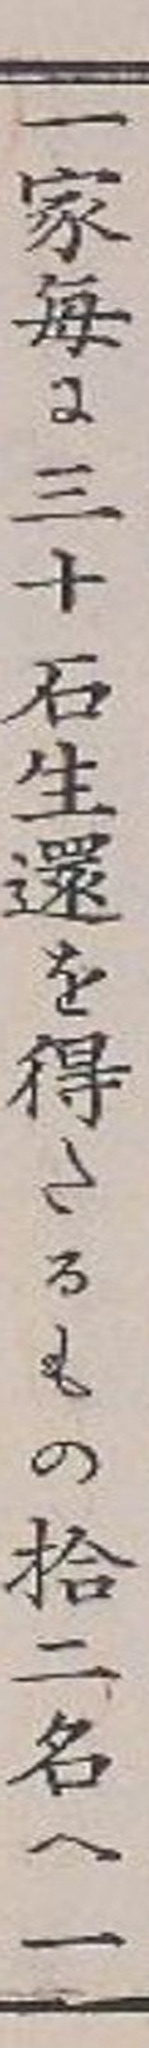一家毎に三十石生還を得たるもの拾二名へ一
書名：南島紀事 下
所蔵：University of the Ryukyus Library
